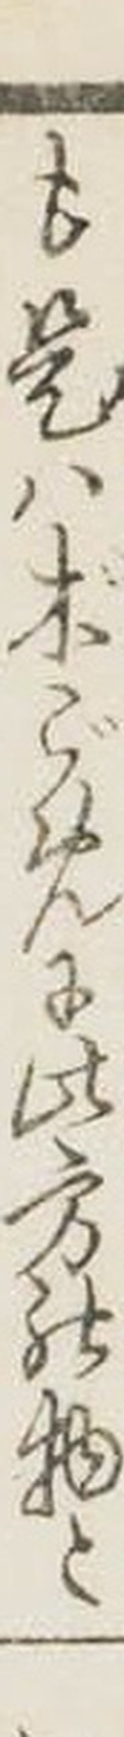も是は木ごめに此方の物と
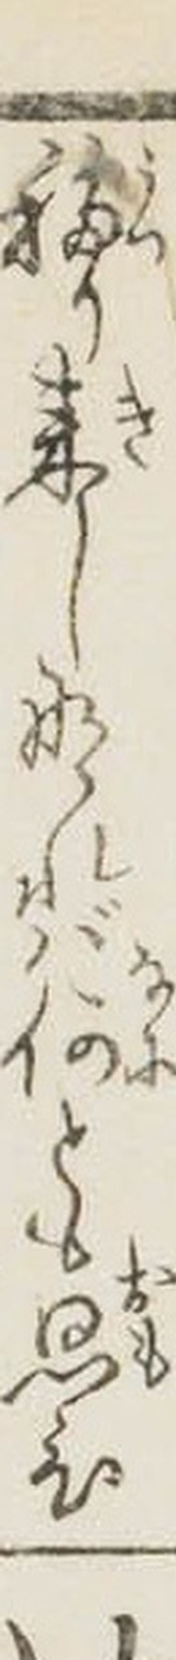移り来しなれば何とも思ひ
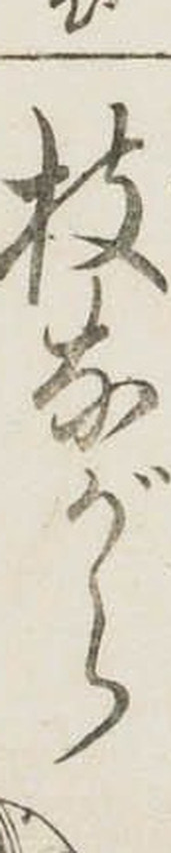枝ながら
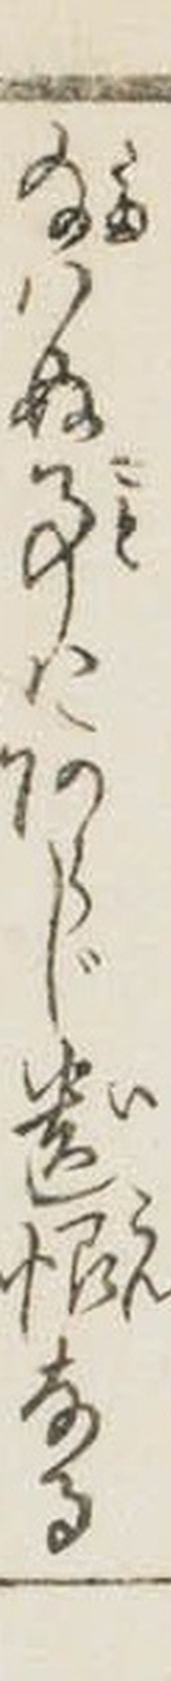給はぬ事はあらじ遺恨なる
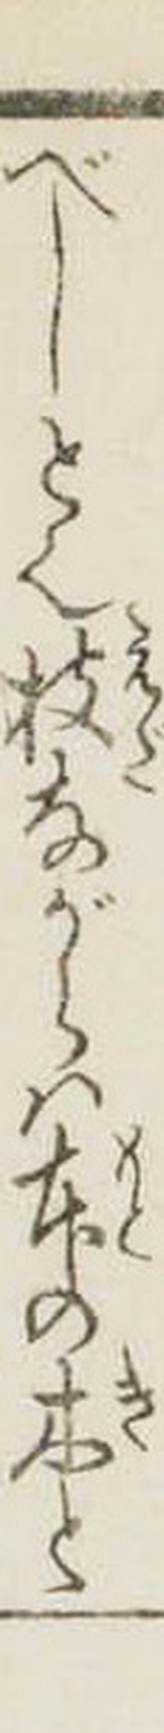べしと也枝ながらは本の木と
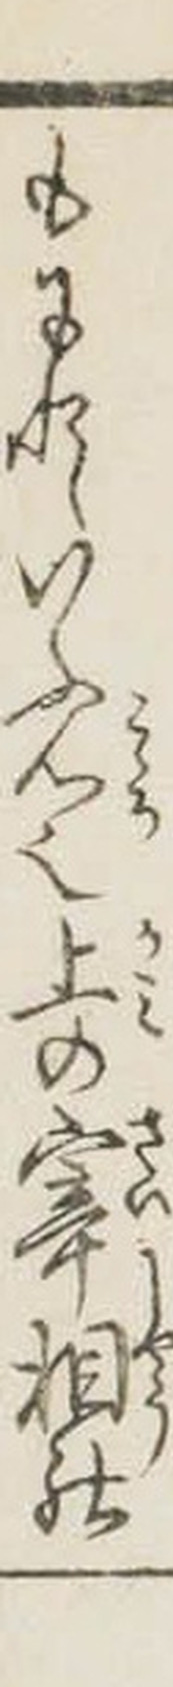もにといふ心也上の宰相の
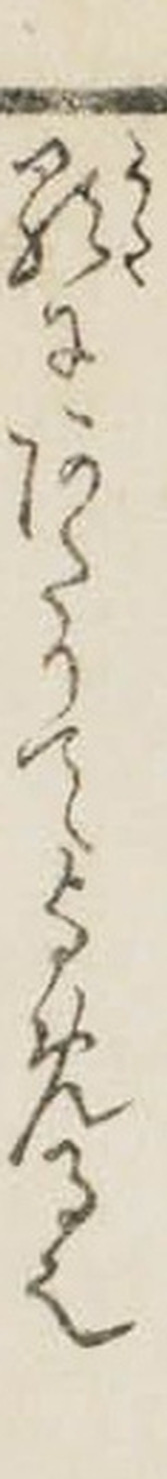歌にあたりてよめる也
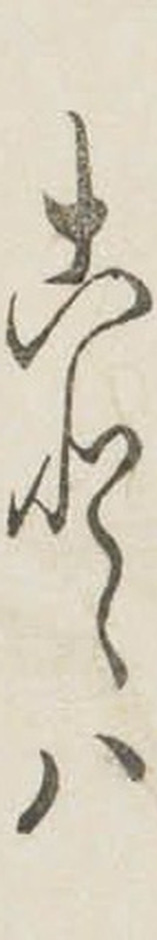ことは
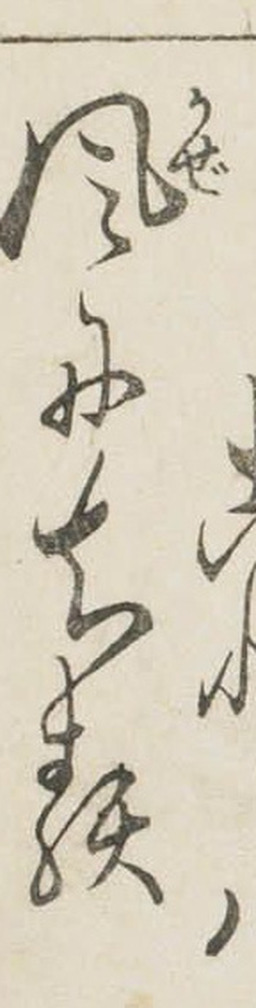風にちる
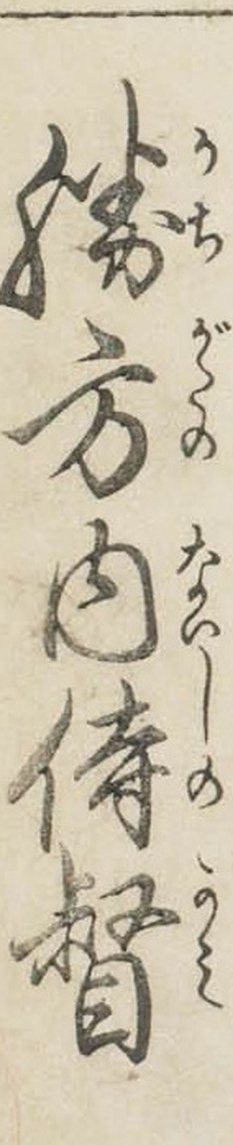勝方内侍督

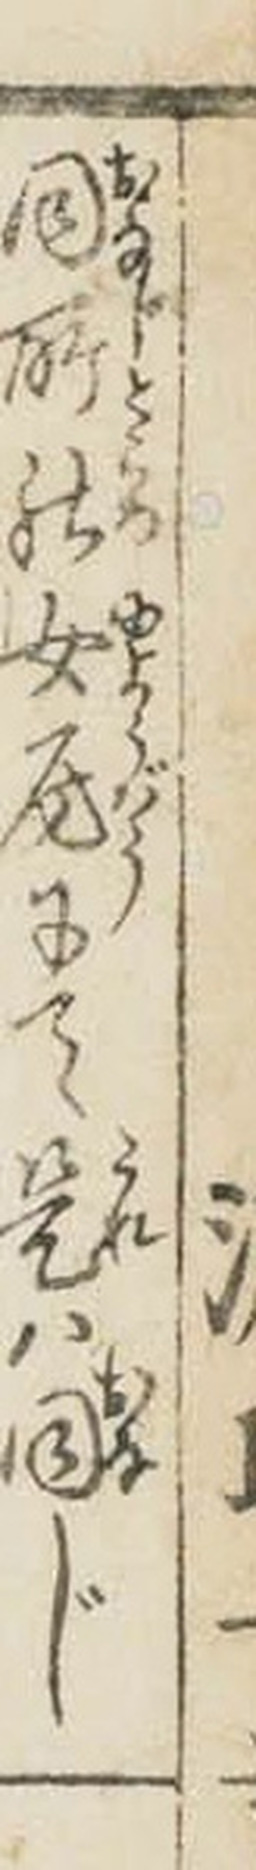同所の女房にて是は同じ
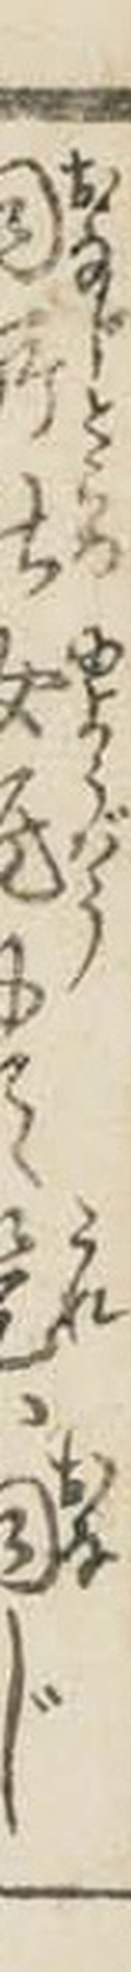同所の女房にて是は同じ
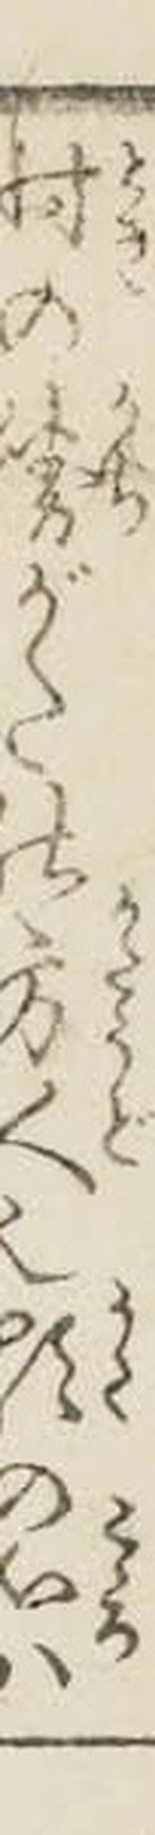時の勝がたの方人也歌の心は
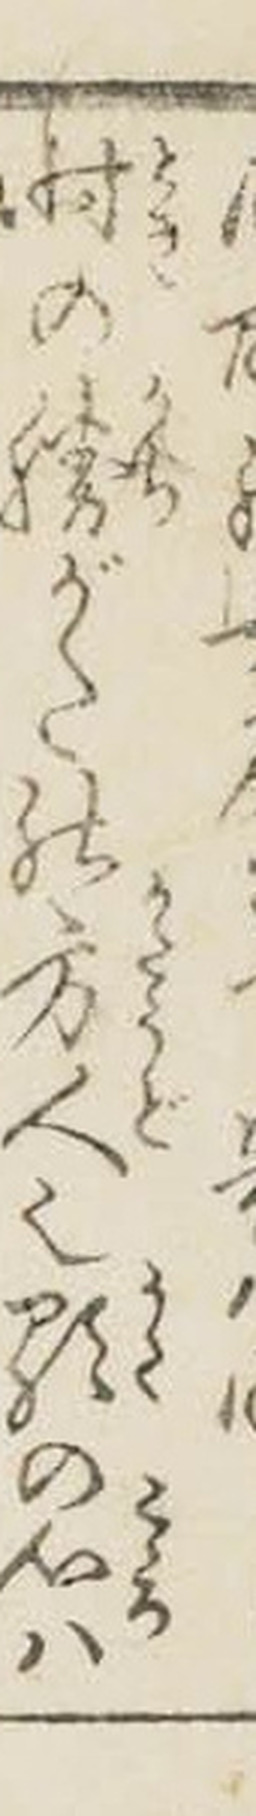時の勝がたの方人也歌の心は
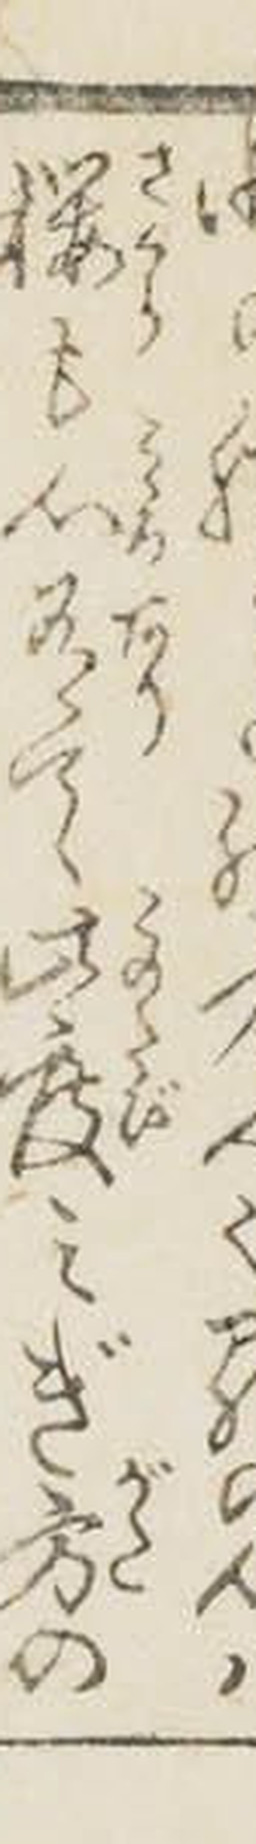桜も心有て此度みぎ方の
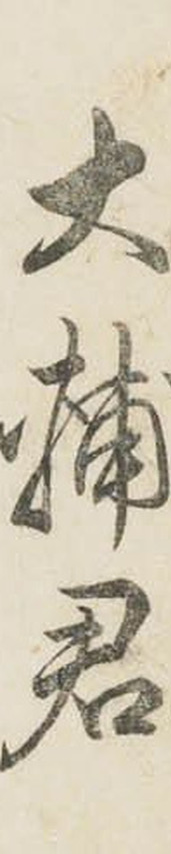大輔君
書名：源氏百人一首
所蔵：東京学芸大学教育コンテンツアーカイブ
